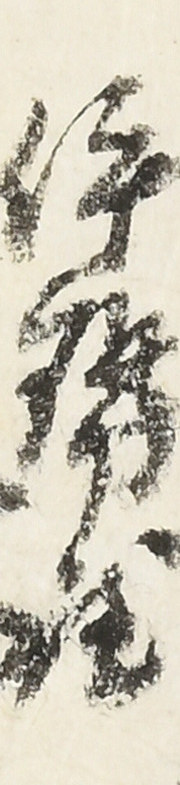伊勢屋
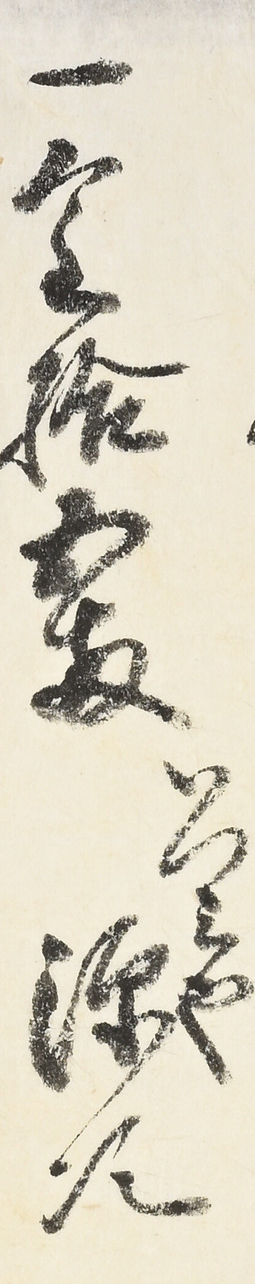一金拾五両源次
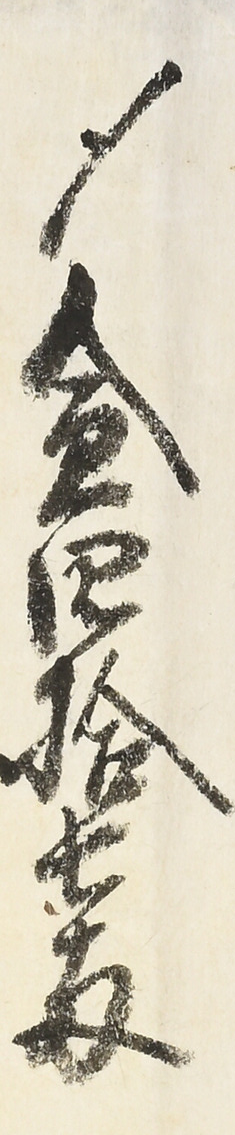〆金四拾七両
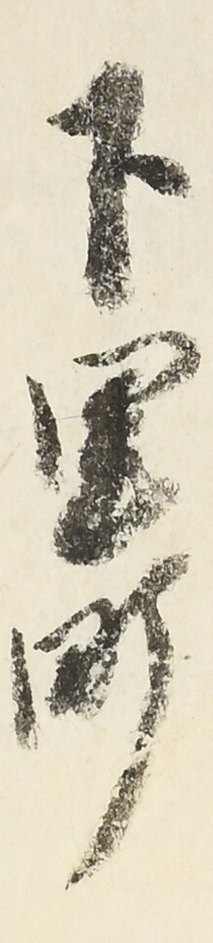下里町
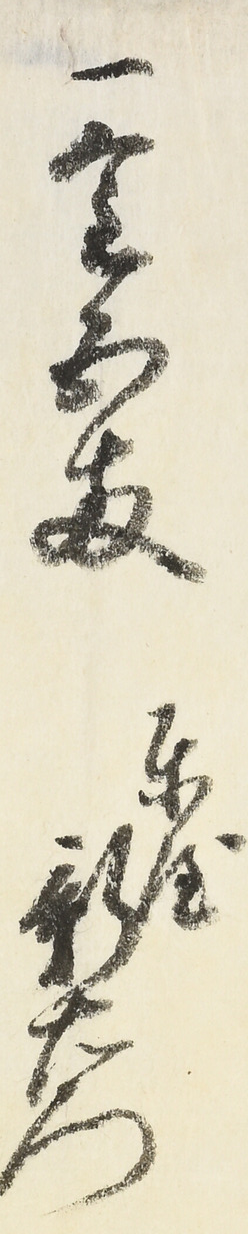一金五両新右衛門
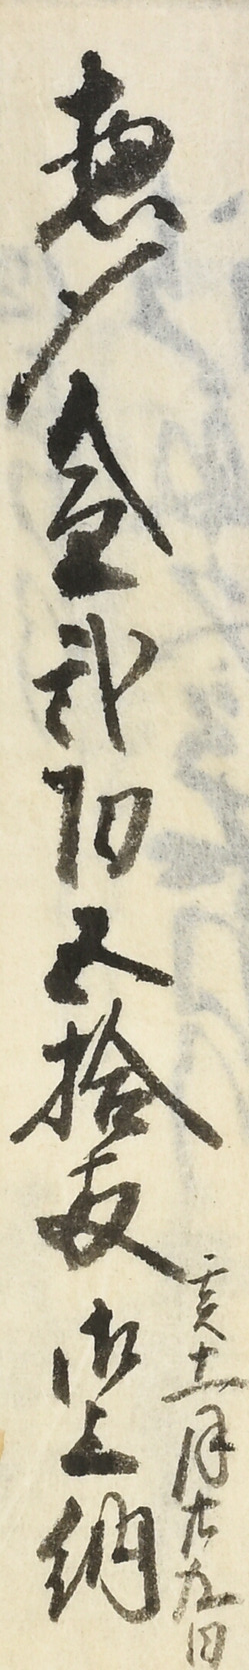惣〆金弐百五拾両御上納
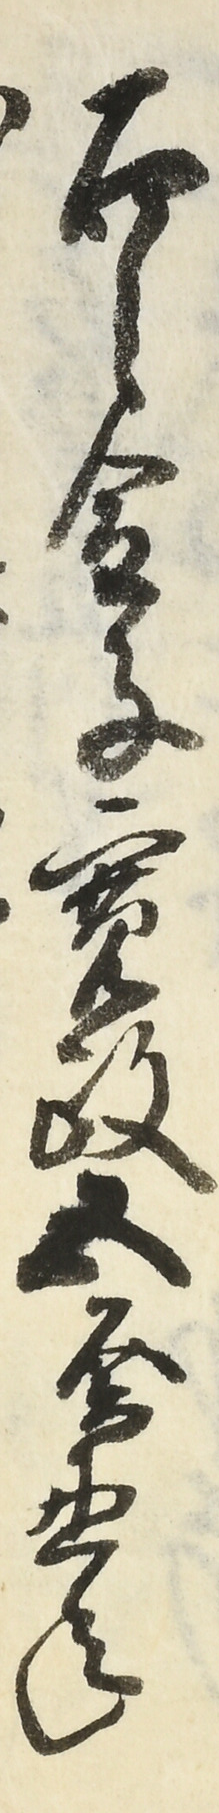右之金子寛政五癸丑年
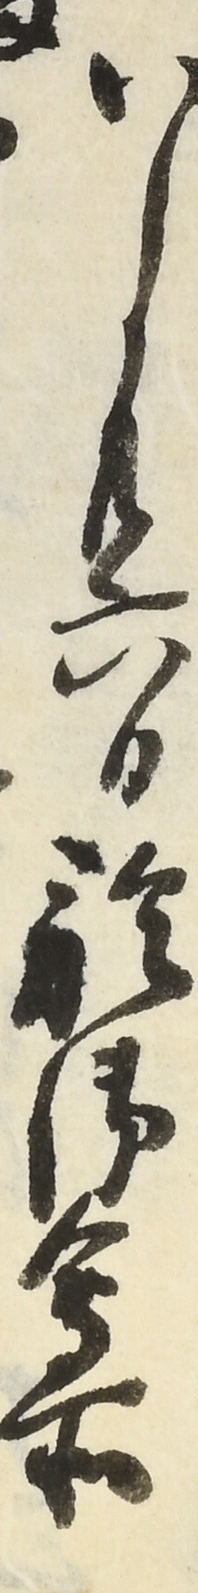八月六日於御会所

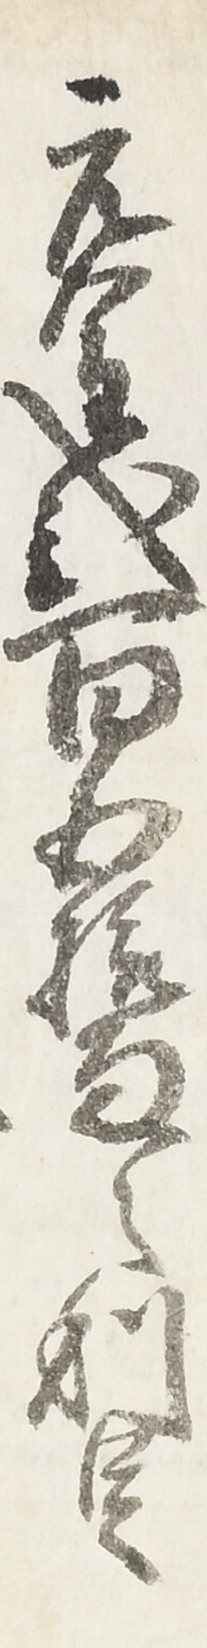元金弐百五拾両之利足
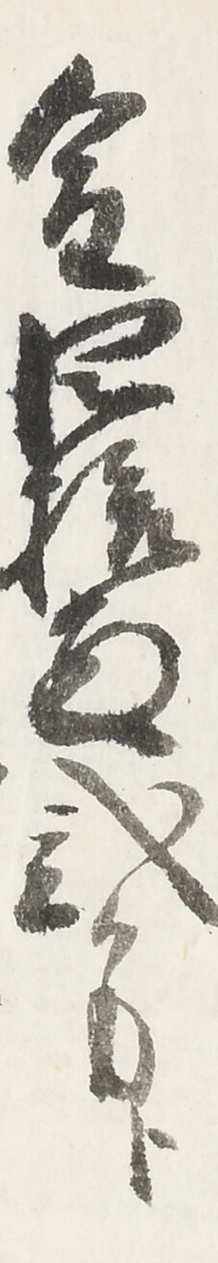金四拾両弐分ト
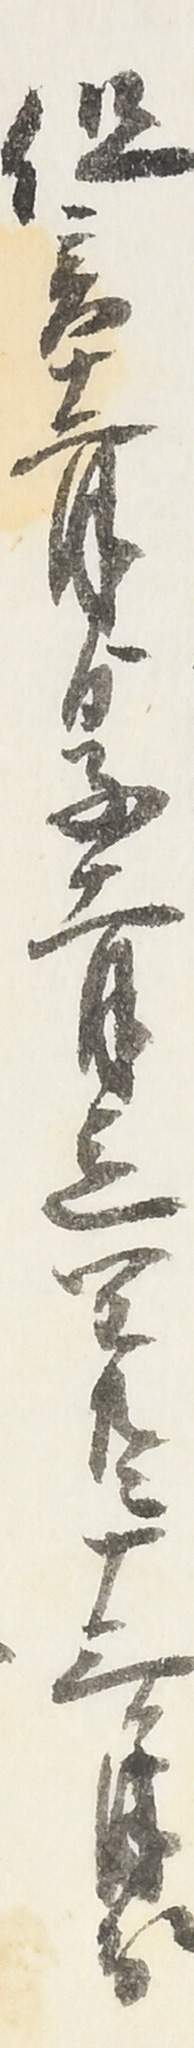但亥十二月ゟ子十一月迄閏共ニ十三日自分
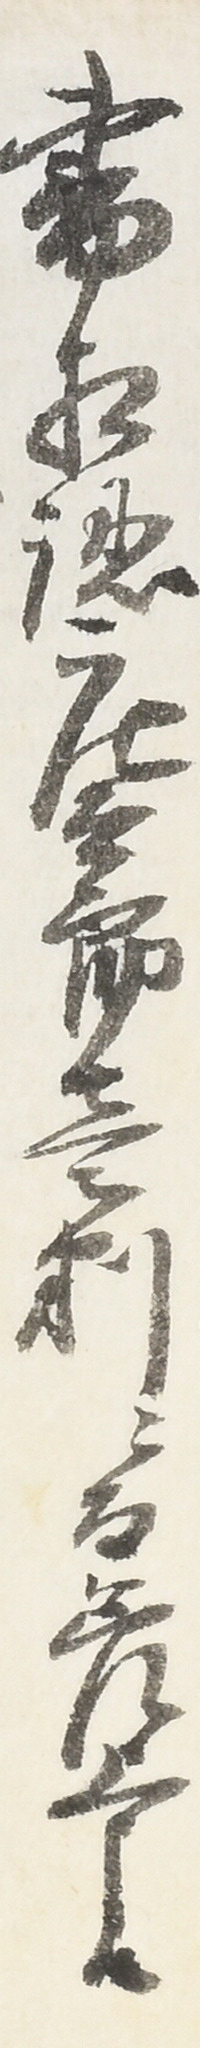書相認庄太郎壱割ニ而差上申候
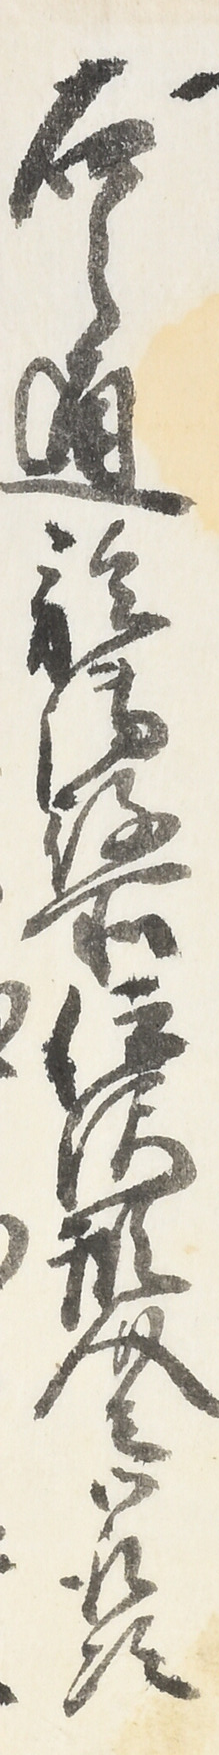右之通於御役所伊沢形介之御取次
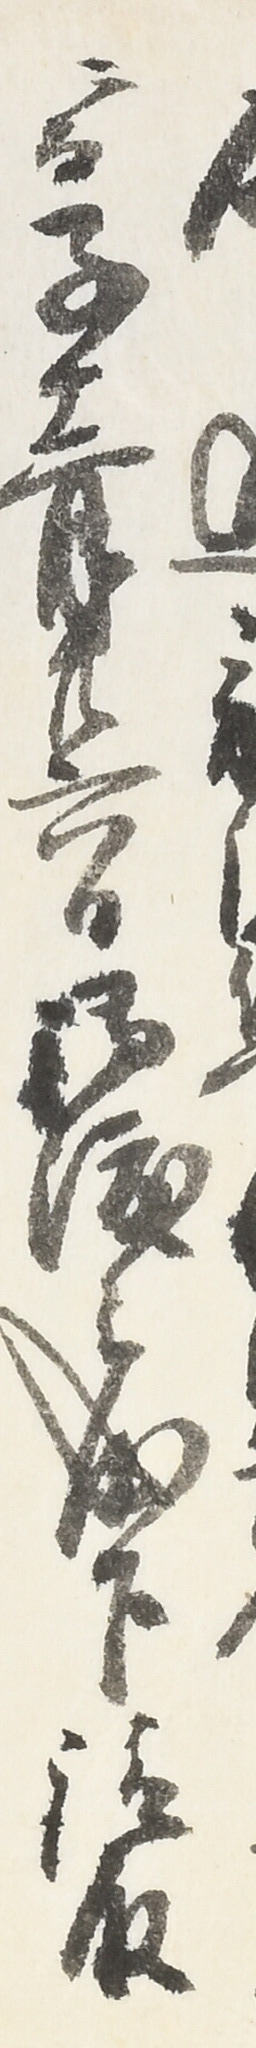ニ而子十二月廿六日御渡被成下請取
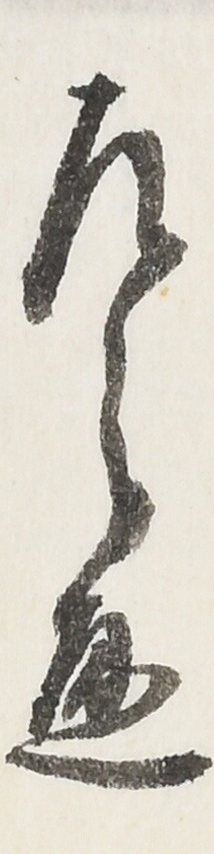左之通
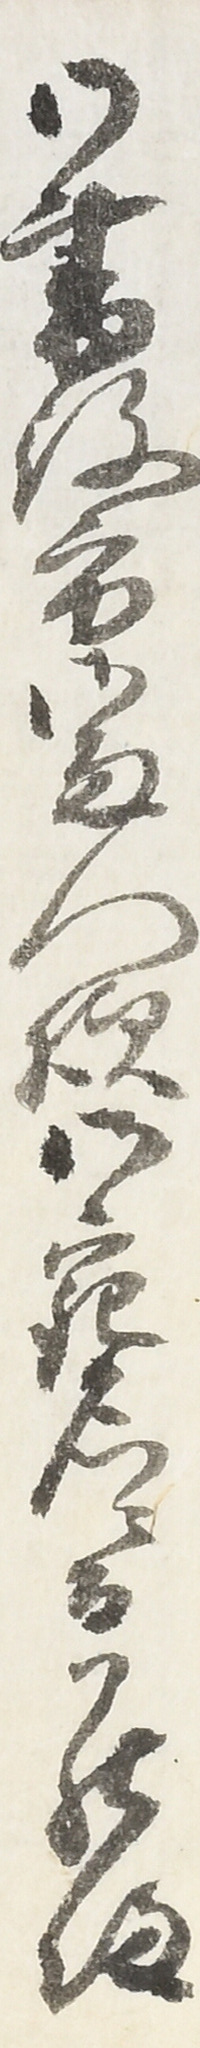御書役方御両人様御宛名ニ而罷帰
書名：御乗出シ御才覚金割合扣帳
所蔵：伊那市立高遠町図書館・合同会社AMANE
